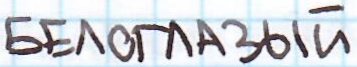белоглазый
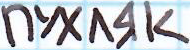пухляк
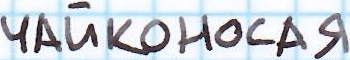чайконосая
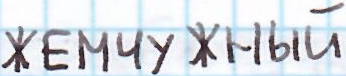жемчужный
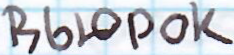вьюрок
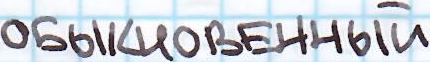обыкновенный
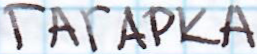гагарка
